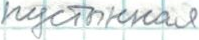пустынная
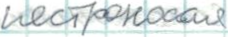пестроносая
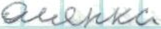оляпка
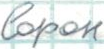ворон
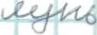лунь
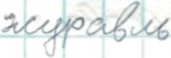журавль
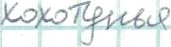хохотунья
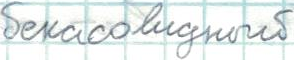бекасовидный
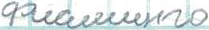фламинго
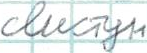свистун
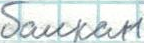балкан
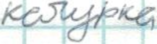качурка
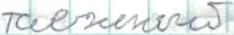таежный
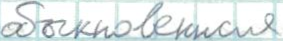обыкновенная
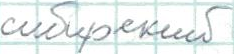сибирский
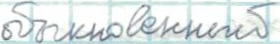обыкновенный
